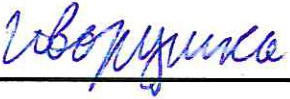говорушка
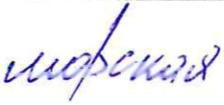морская
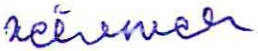жёлтая
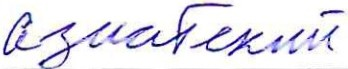азиатский
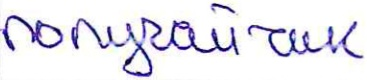попугайчик
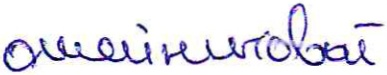ошейниковый
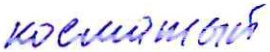косматый
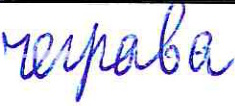чеграва
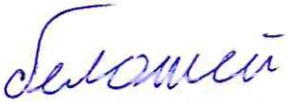белошей
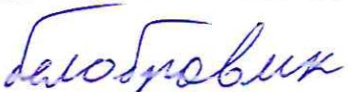белобровик
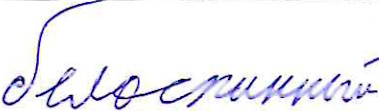белоспинный
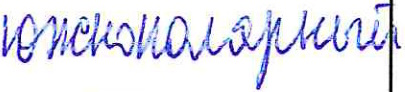южнополярный
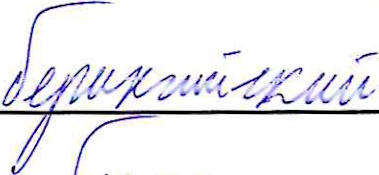берингийский
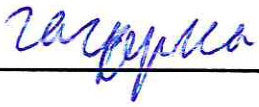гагарка
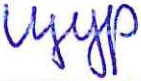щур
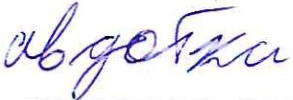авдотка
